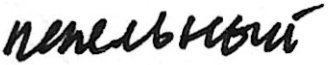пепельный
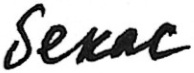бекас
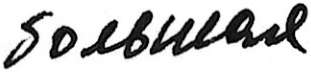большая
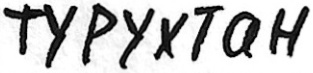турухтан
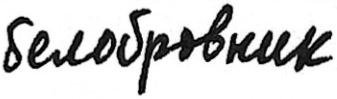белобровник
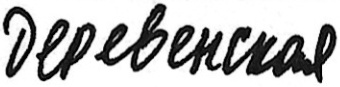деревенская
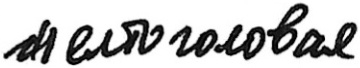желтоголовая
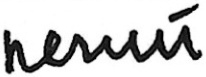пегий
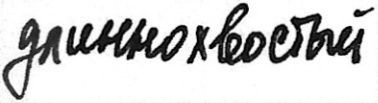длиннохвостый
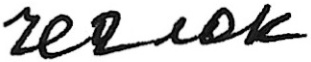чеглок
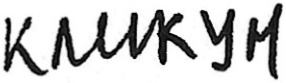кликун
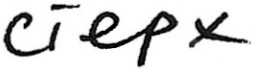стерх
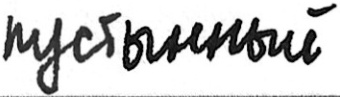пустынный
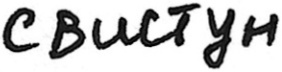свистун
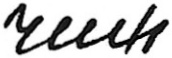чиж
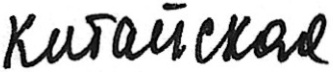китайская
